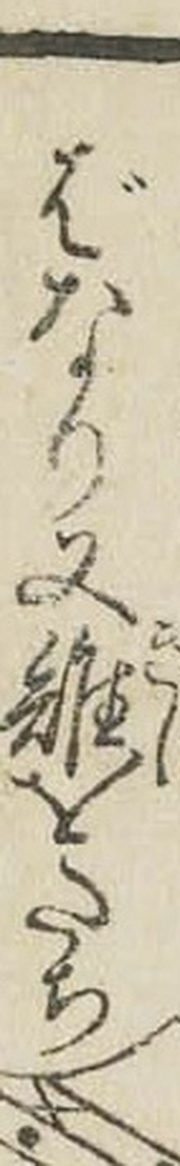ばなり又雉をたち
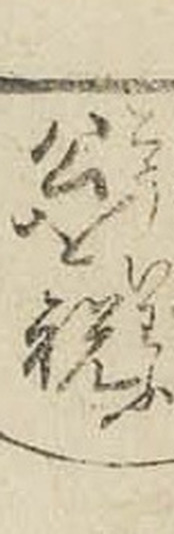公を祝
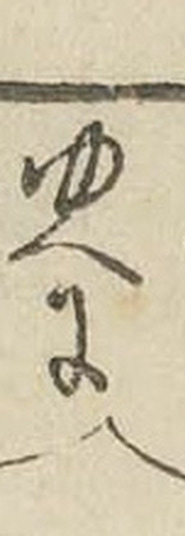ゆへに
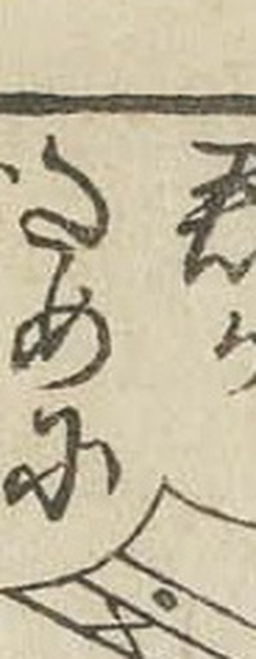ために
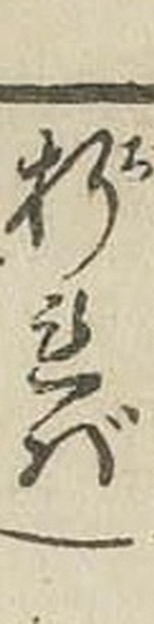折れば
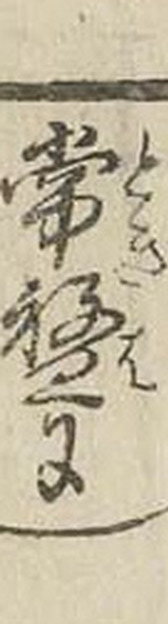常盤に
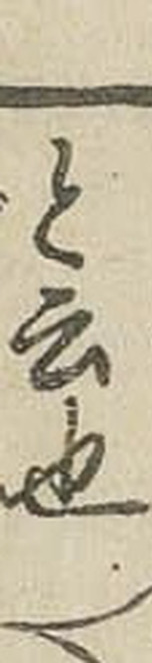と云也
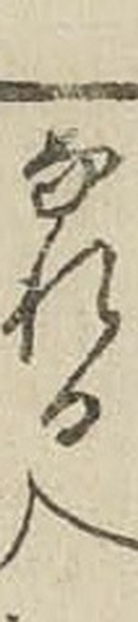なれる
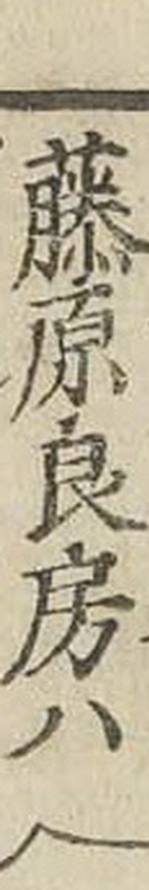藤原良房ハ
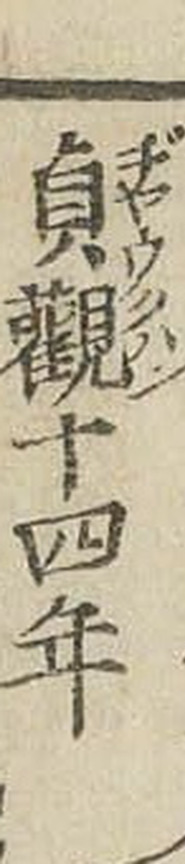貞観十四年
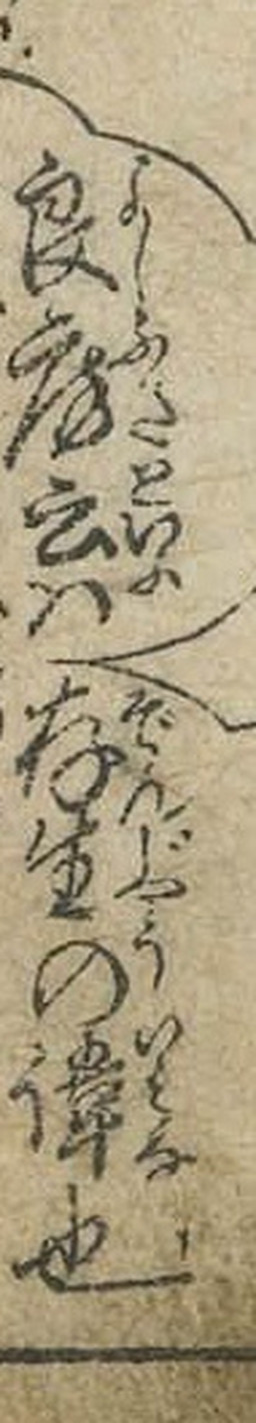良房云は存生の諱也
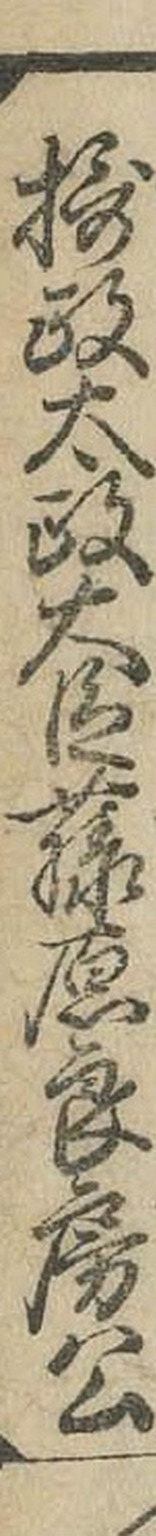摂政太政大臣藤原良房公
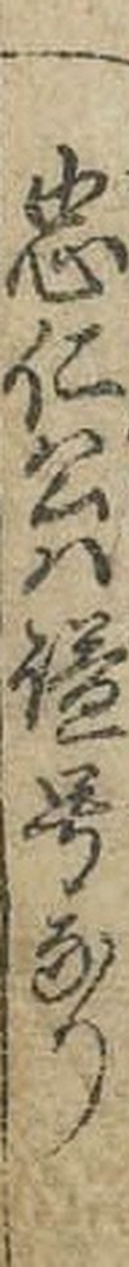忠仁公は謚号なり

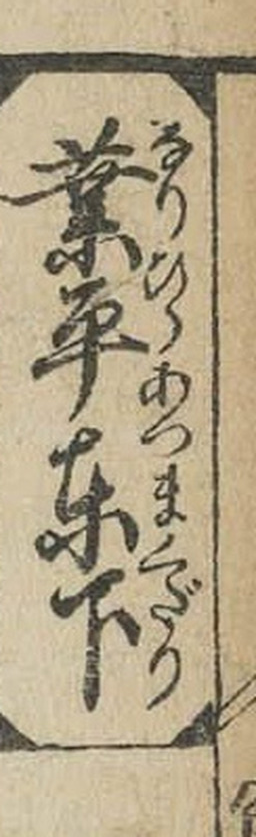業平東下
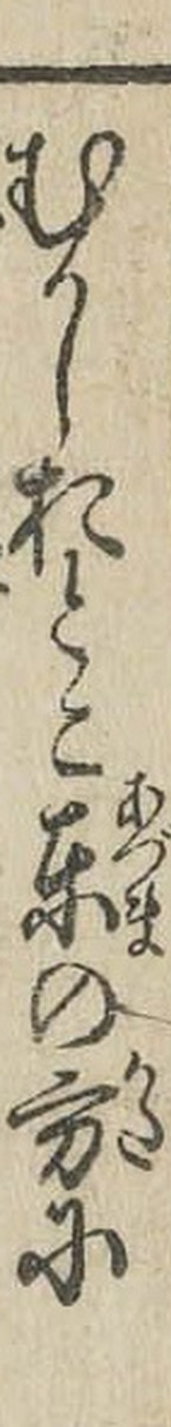むかしおとこ東の方に
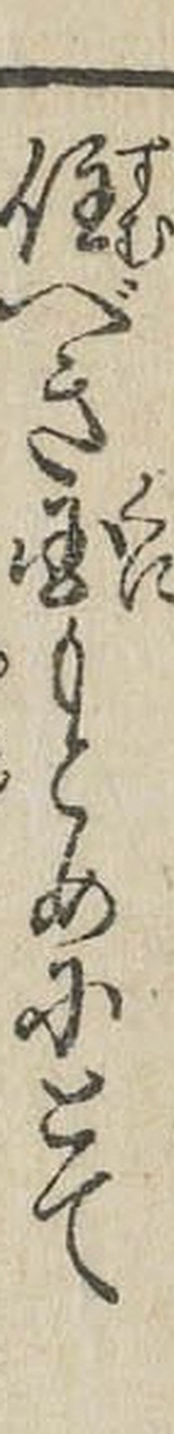住べき国もとめにとて
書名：絵本写宝袋 9巻 1之巻
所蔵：東京学芸大学教育コンテンツアーカイブ
